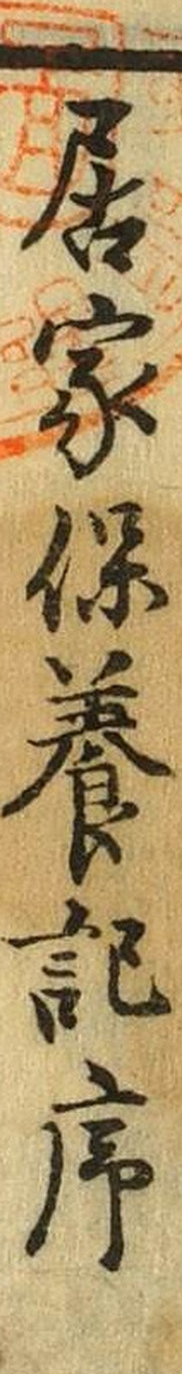居家保養記序
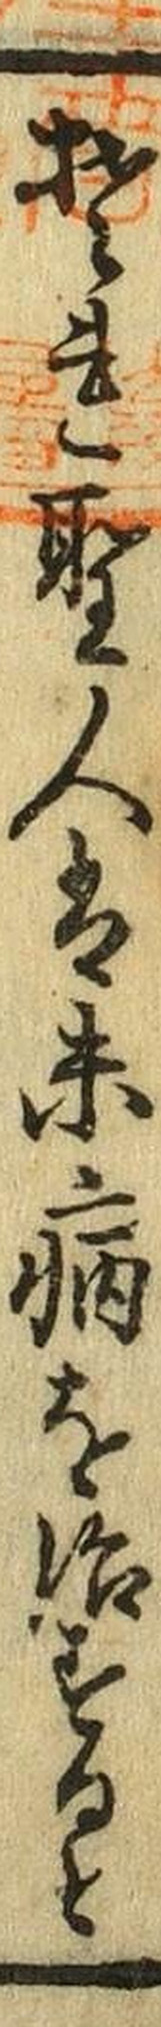それ聖人は未病を治すると
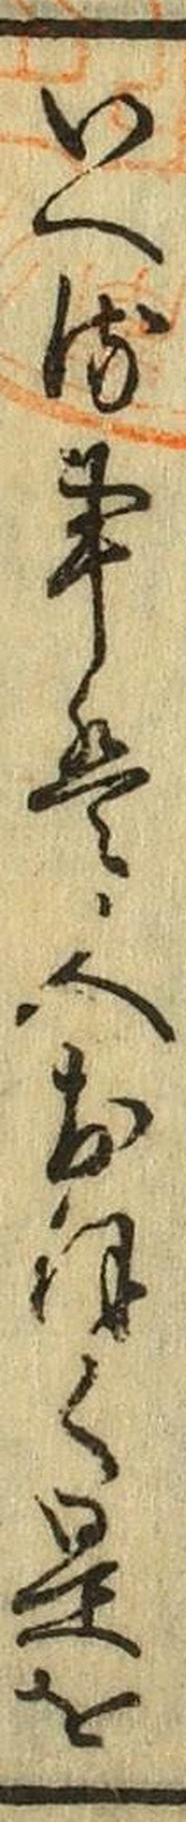いへる事は人おほく是を
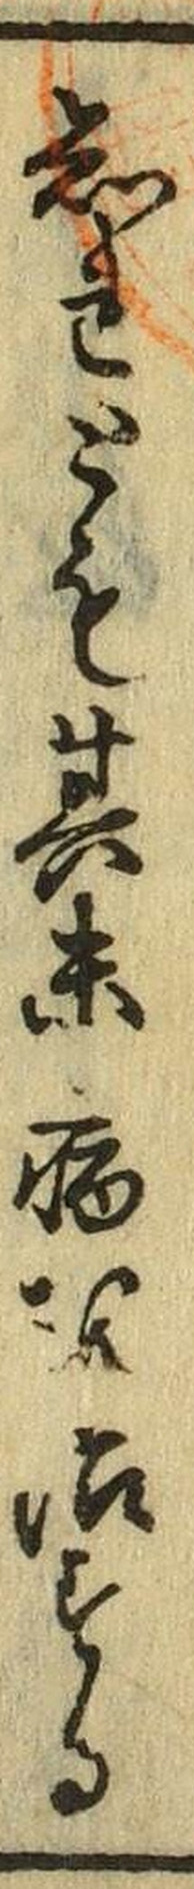知れとも其未病を治する
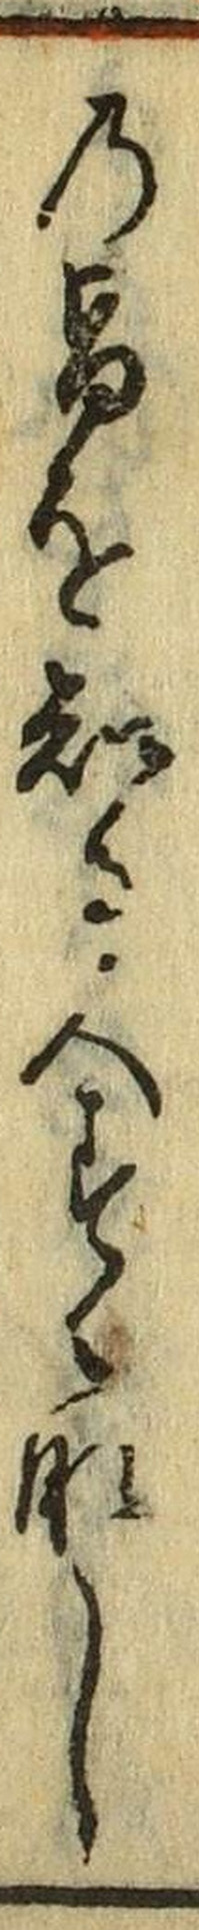の旨を知る人すくなし
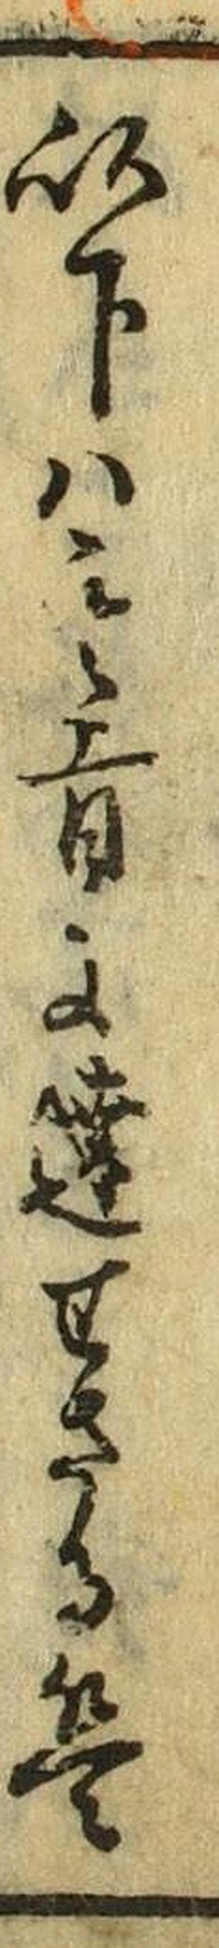以下は其旨に達せさるは
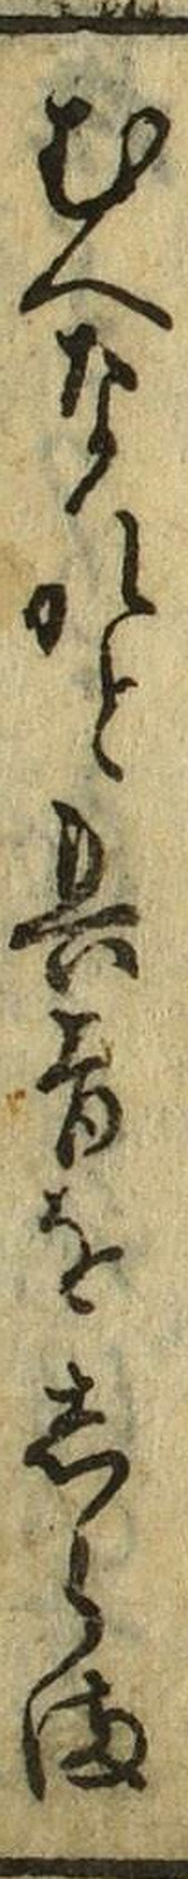むへなれと其旨をしらま
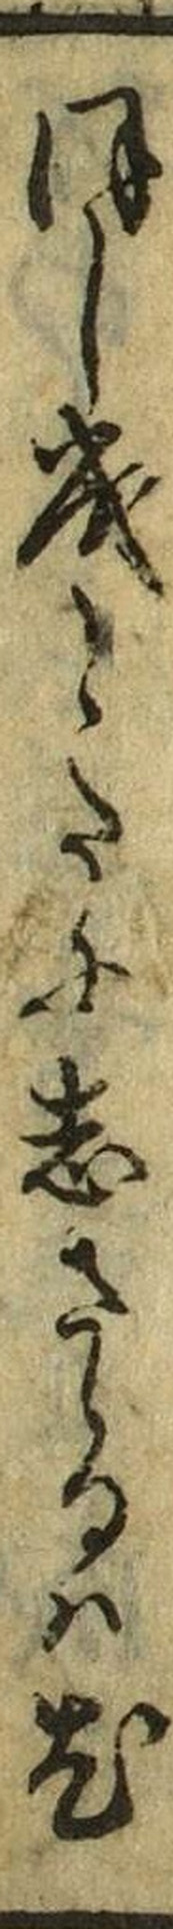ほしきとたに志さゝるは尤
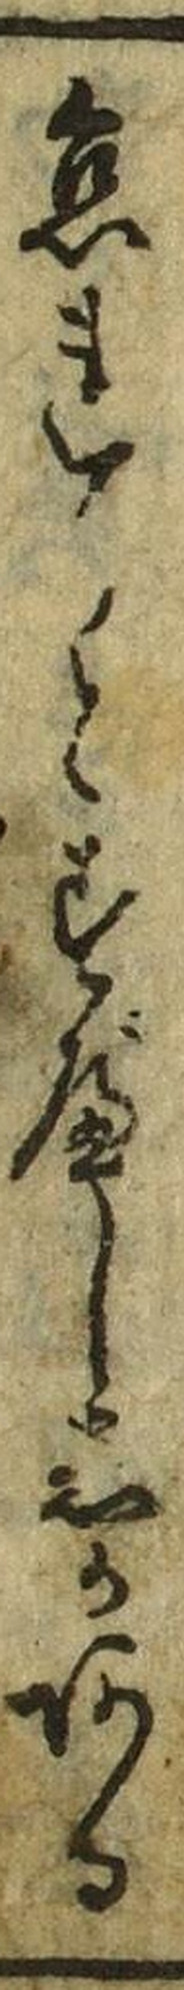怠れりとすべししかある
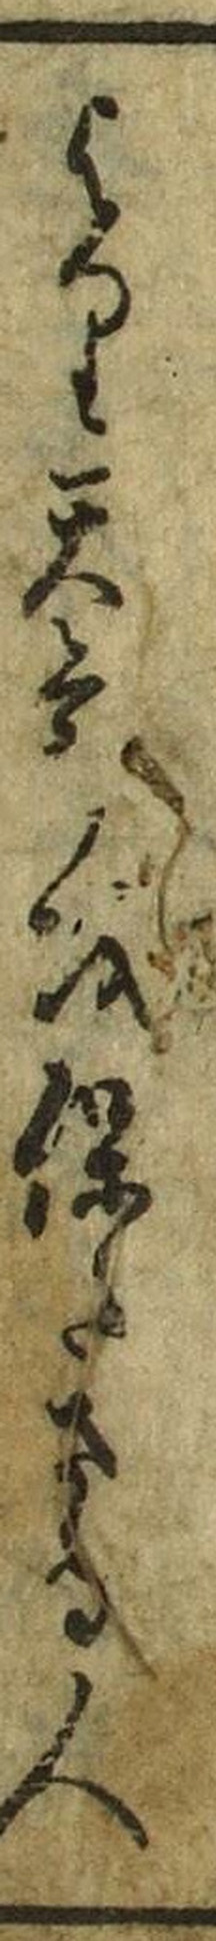より天を保たさる人

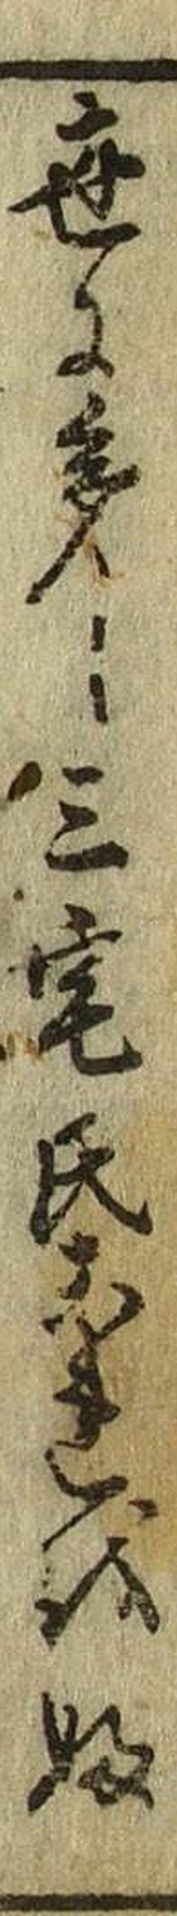世に多し三宅氏これをふ
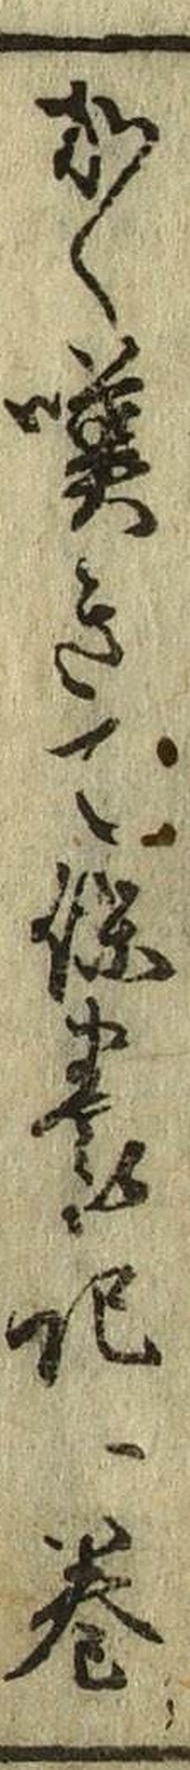かく嘆きて保養記一巻
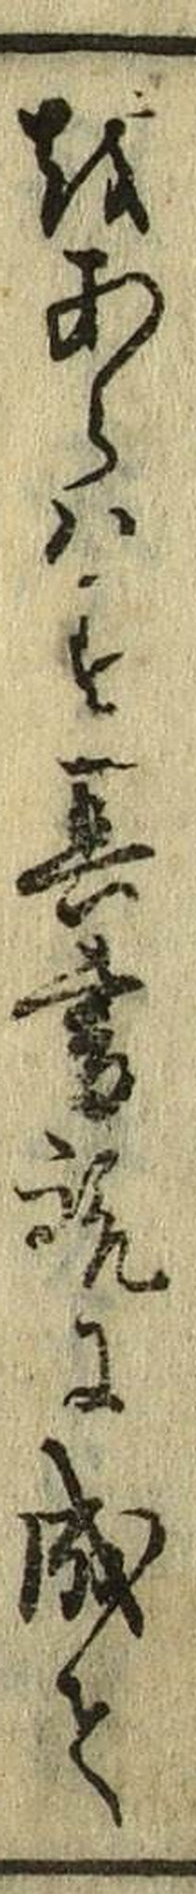をあらはす其書既に成て
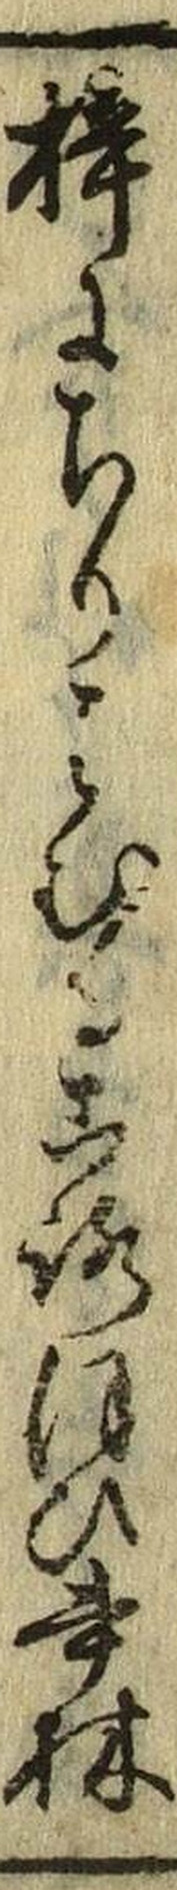梓にちりはむるころほひ書林
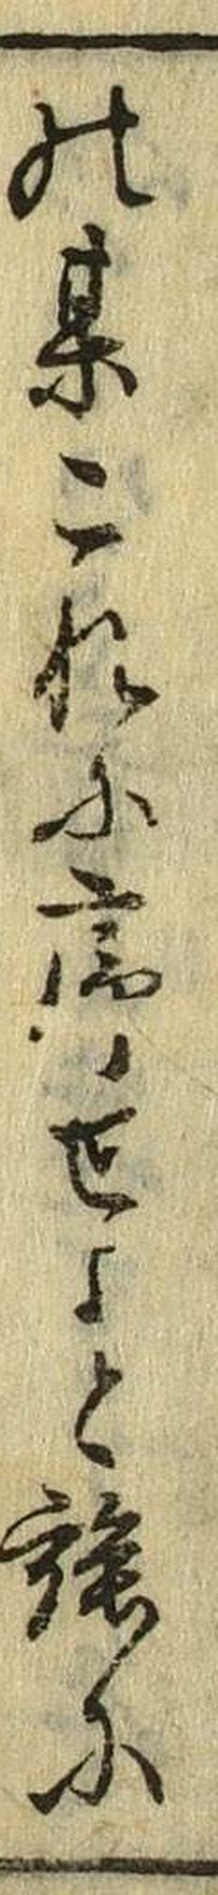の某これに序せよと強に
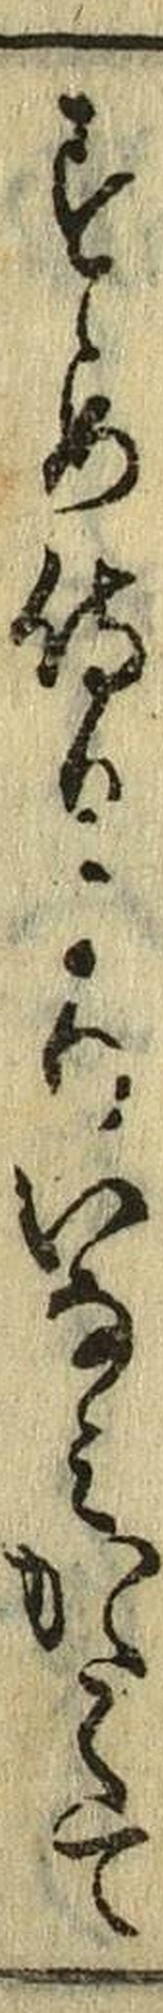すゝめ侍るよりいなみかたくて
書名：居家養生記
